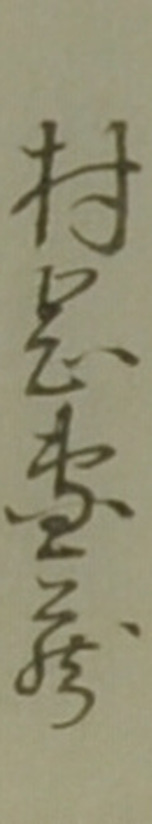村岡団蔵
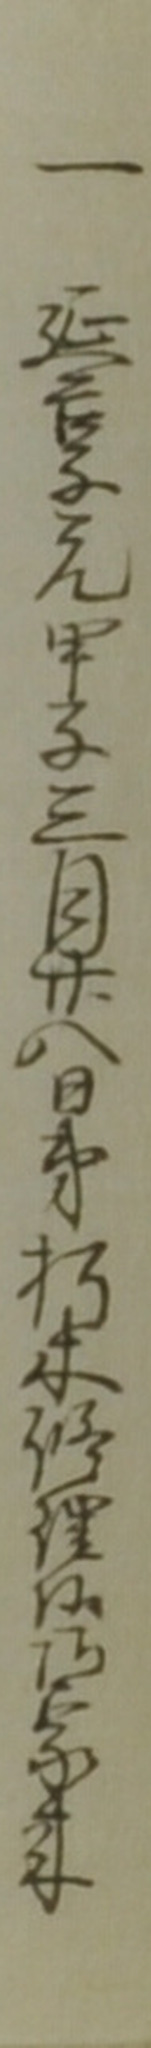一延享元甲子三月廿八日弟朽木修理様御家来
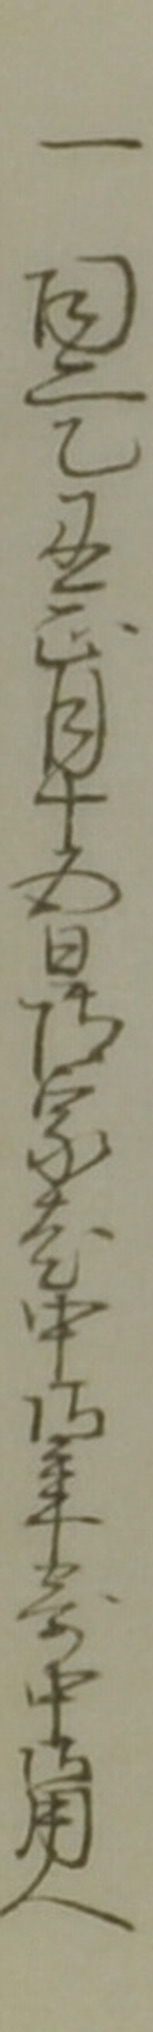一同二乙丑正月十五日御家老中御年寄中御用人
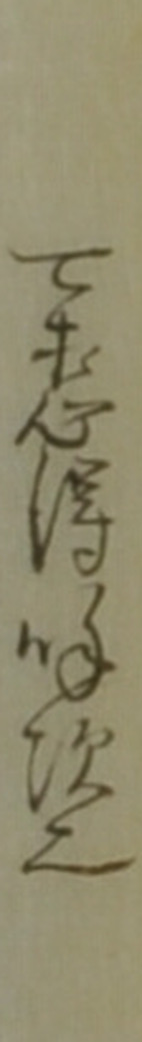可相心得呼次也

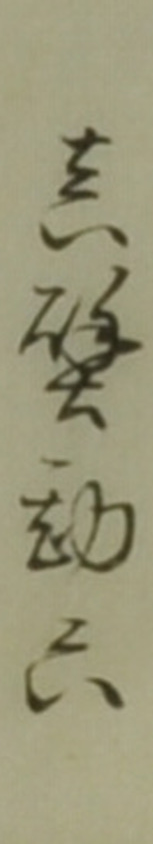真壁勘六
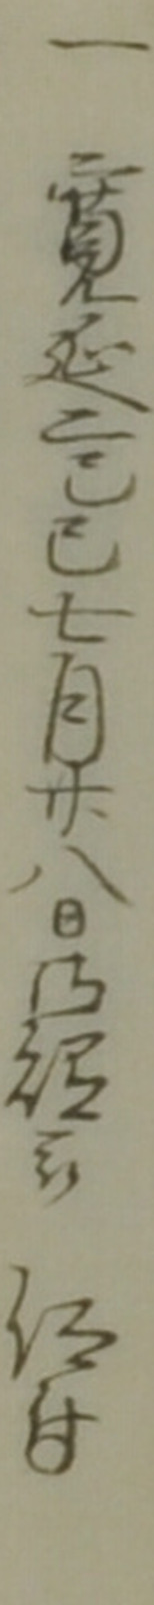一寛延二己巳七月廿八日御賄被仰付
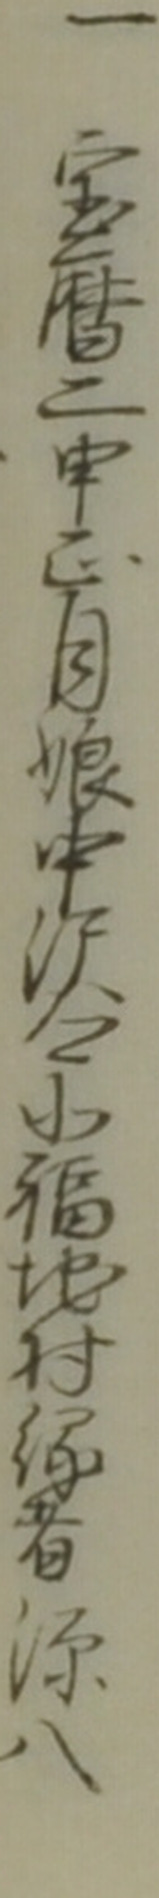一宝暦二申正月娘中沢郷北福地村縁者源八
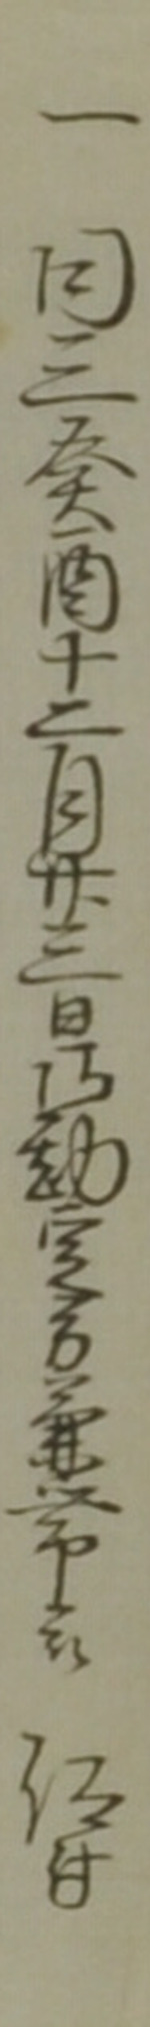一同三癸酉十二月廿三日御勘定方兼帯被仰付
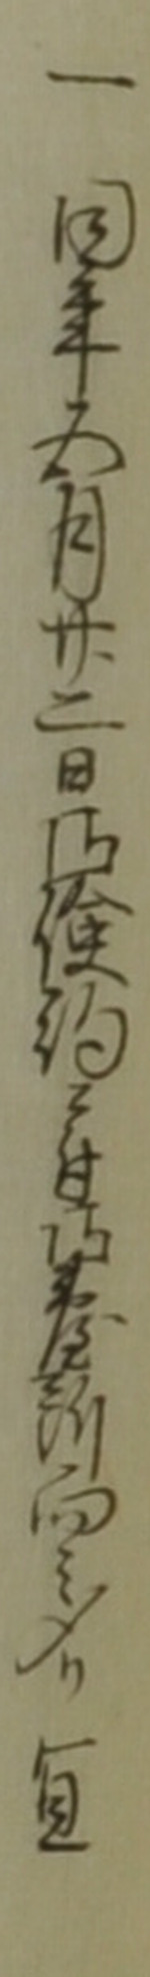一同年五月廿二日御倹約ニ付御台所向之〆宜
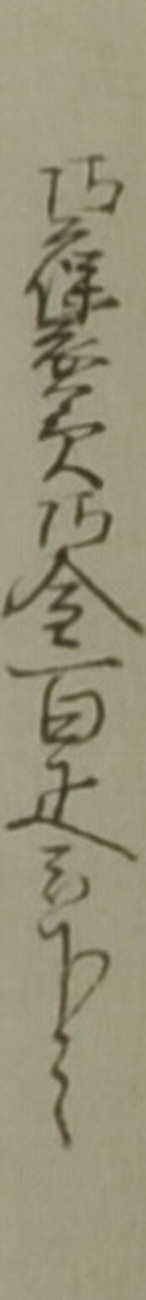御褒美御金百疋被下之
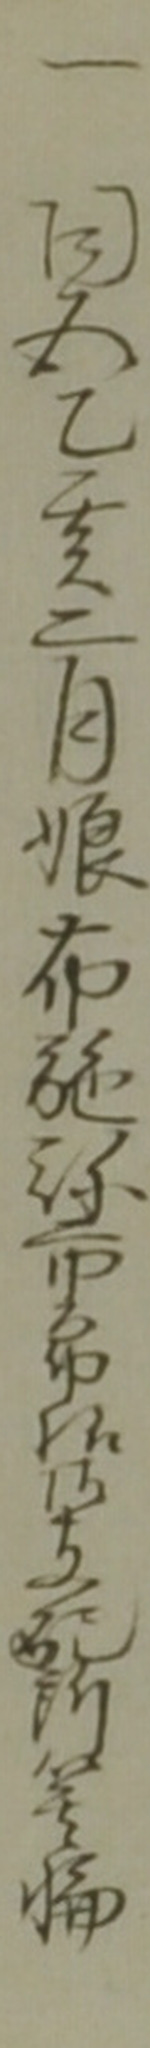一同五乙亥二月娘布施弥市郎様御支配所箕輪
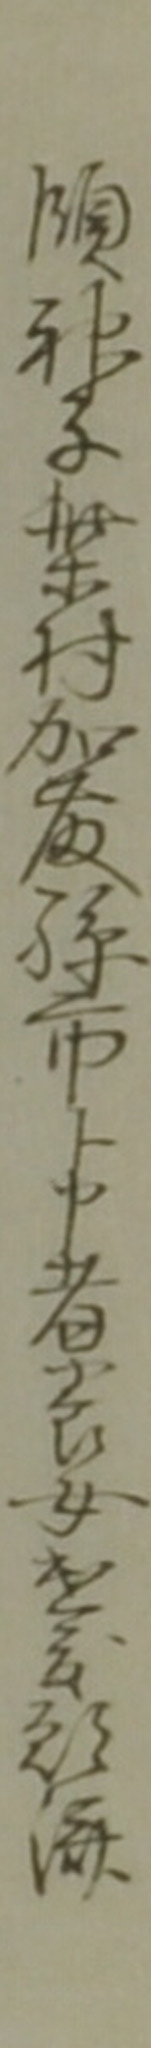領神子柴村加藤孫市申者養女遣度願済
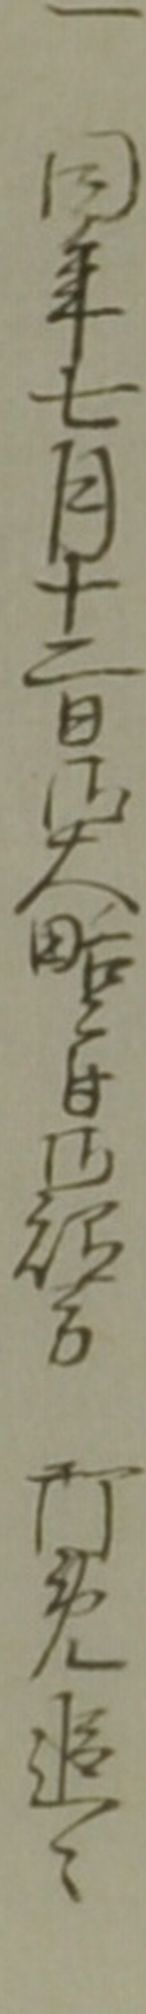一同年七月十二日御大略ニ付御賄方御免追々
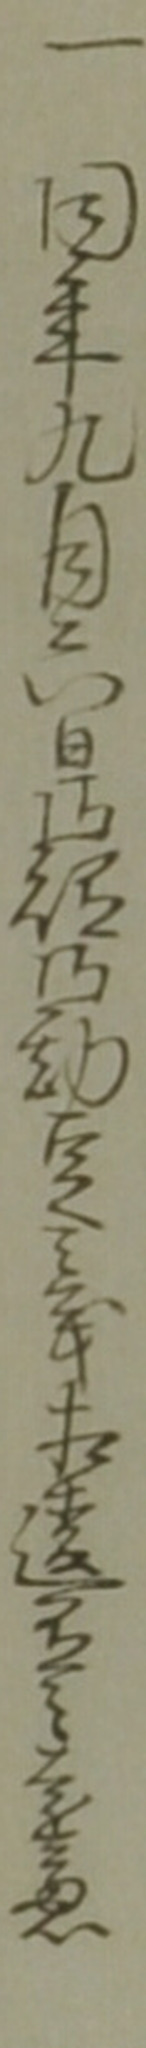一同年九月六日御賄御勘定之義相違有之遠慮
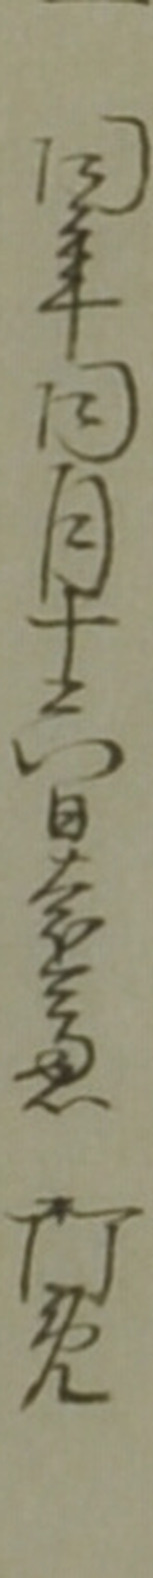一同年同月十六日遠慮御免
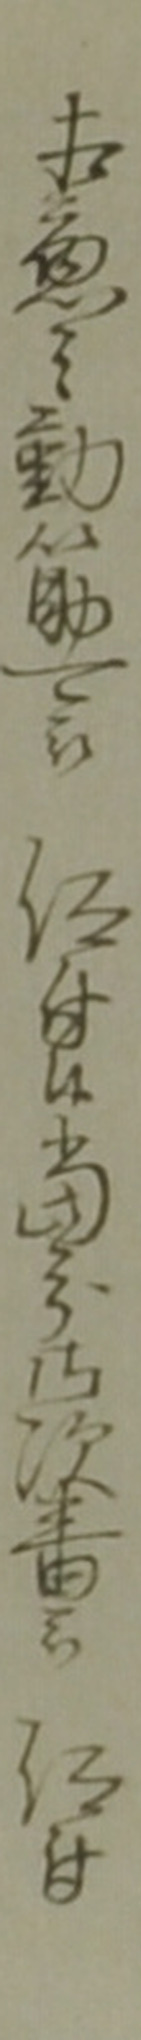相応之勤筋可被仰付候当分御次番被仰付
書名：無足廃家（弐）
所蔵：伊那市立高遠町図書館・合同会社AMANE
